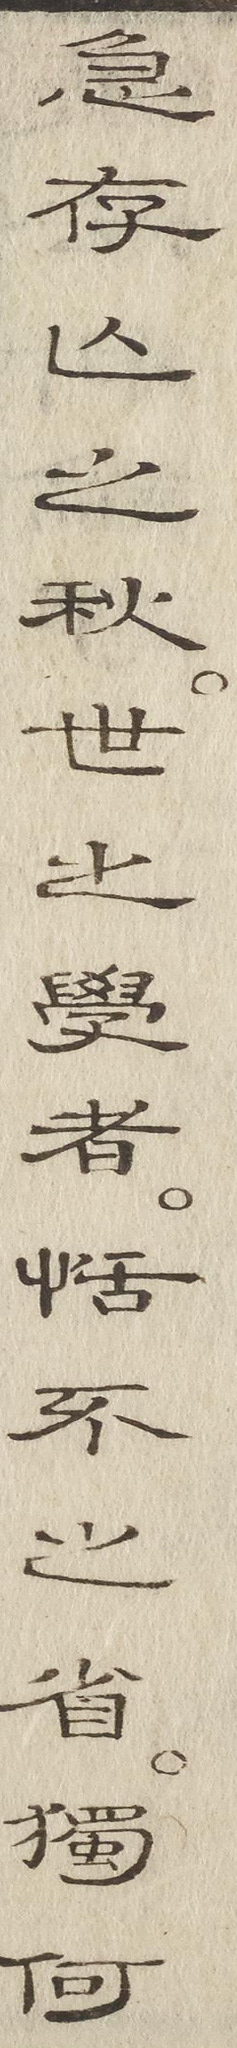急存亡之秋。世之学者。恬不之省。独何
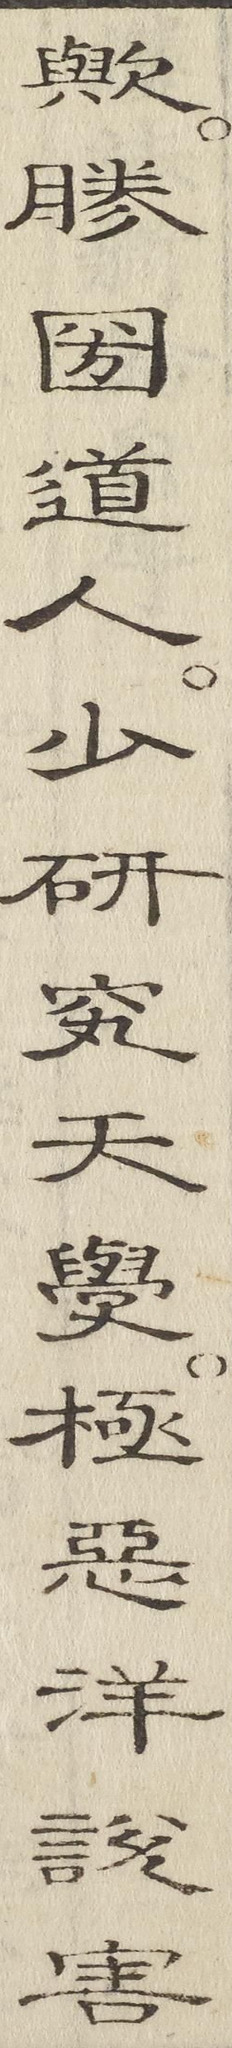歟。勝圀道人。少研究天学。極悪洋説害
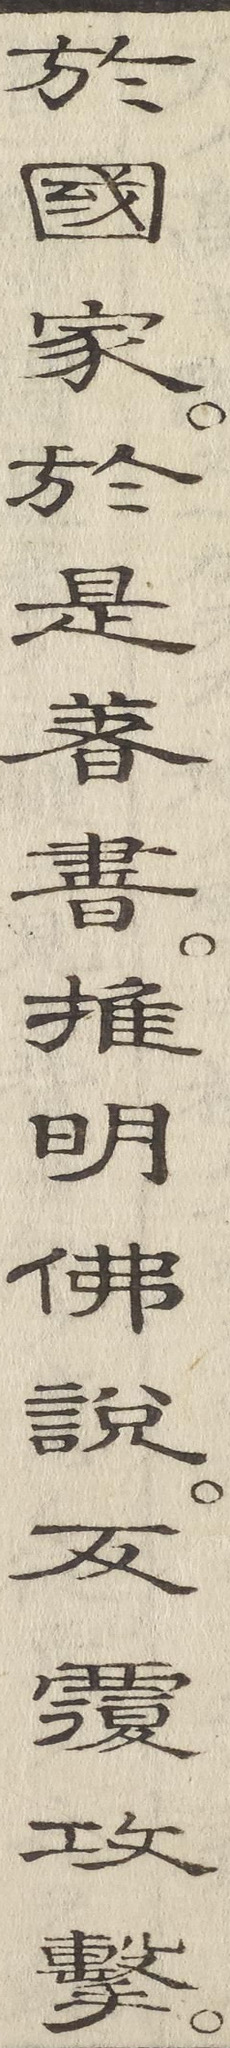於国家。於是善書。推明仏説。反覆攻撃。
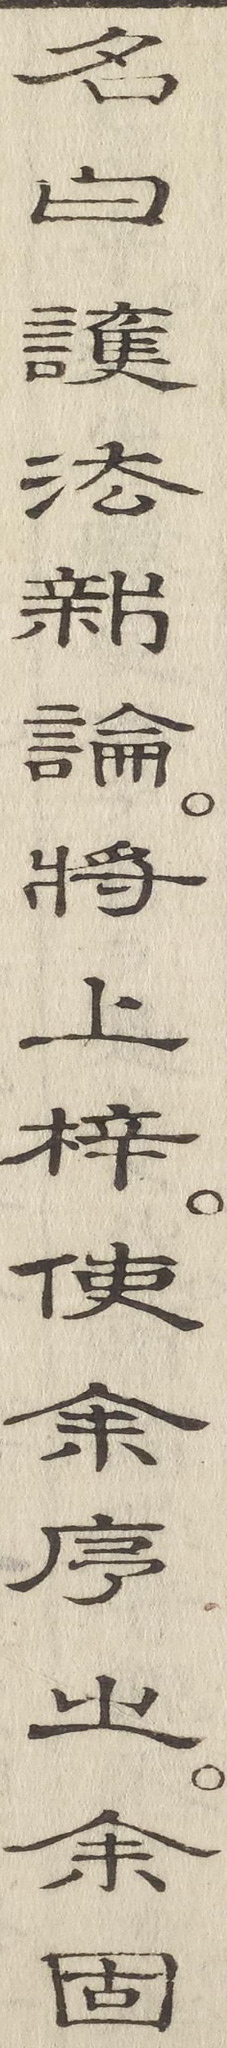名曰護法新論。将上梓。使余序之。余固
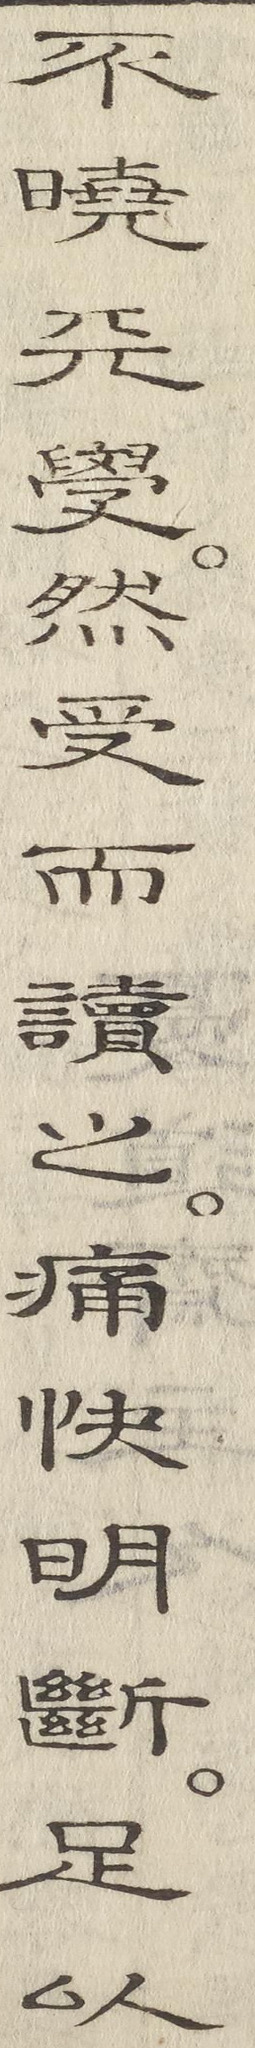不暁天学。然受而読之。痛快明断。足以
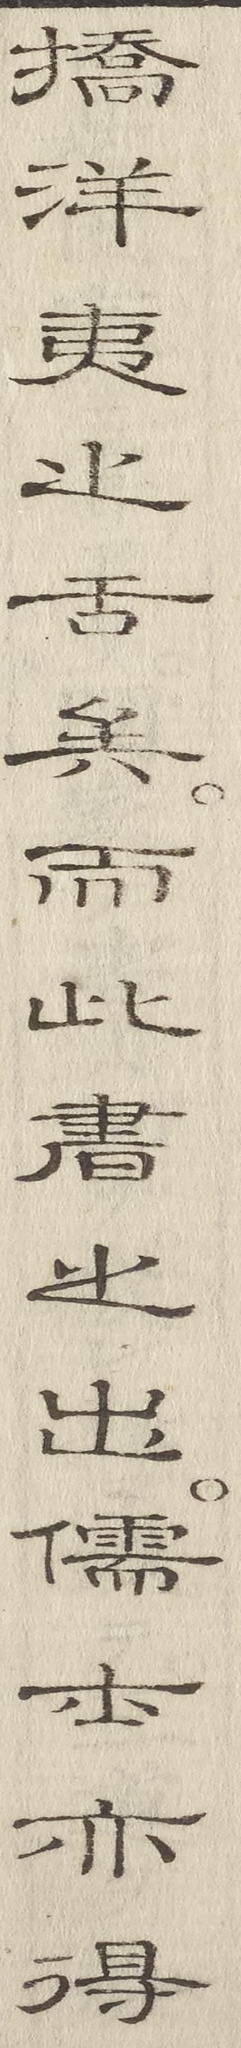撟洋夷之舌矣。而此書之出。儒士亦得
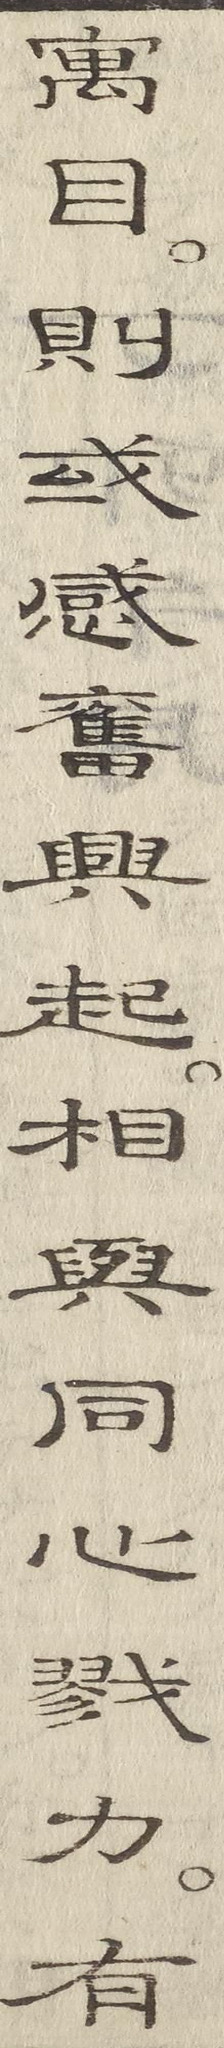寓目。則或感奮興起。相与同心戮力。有
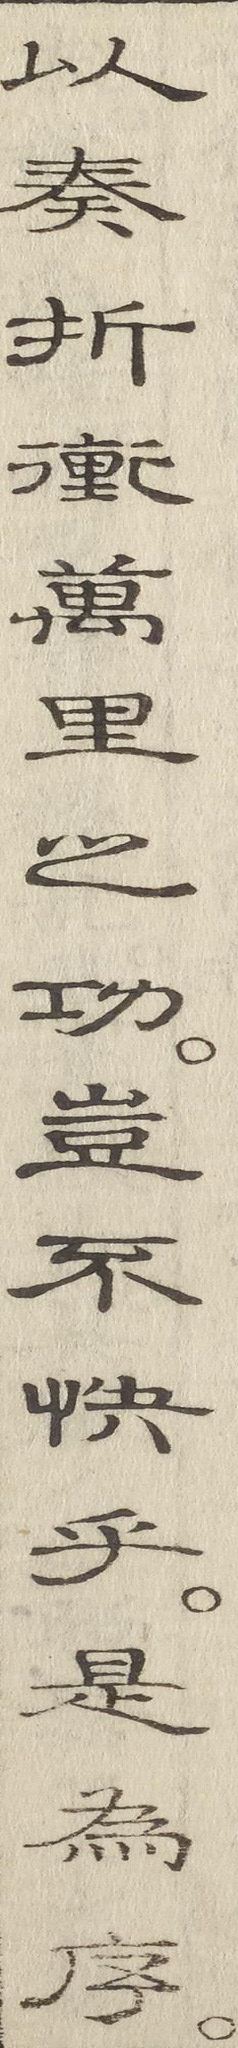以奏折衝萬里之功。豈不快乎是。為序。

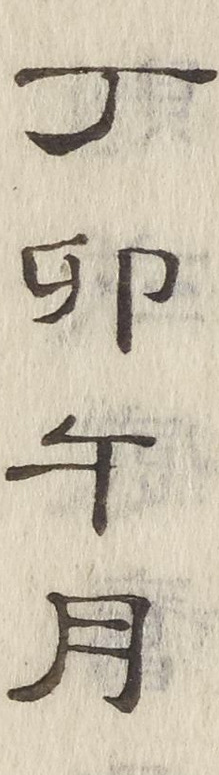丁卯午月
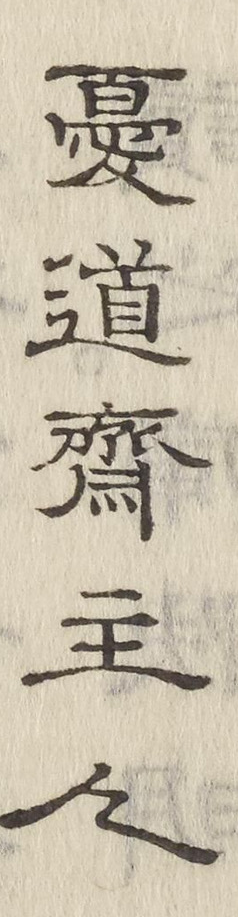憂道齋主人
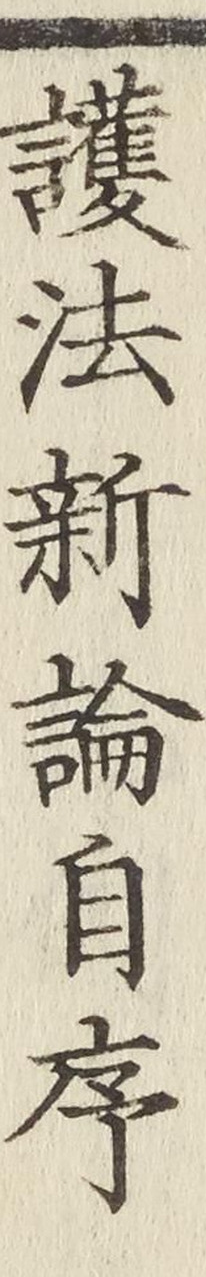語法新論自序
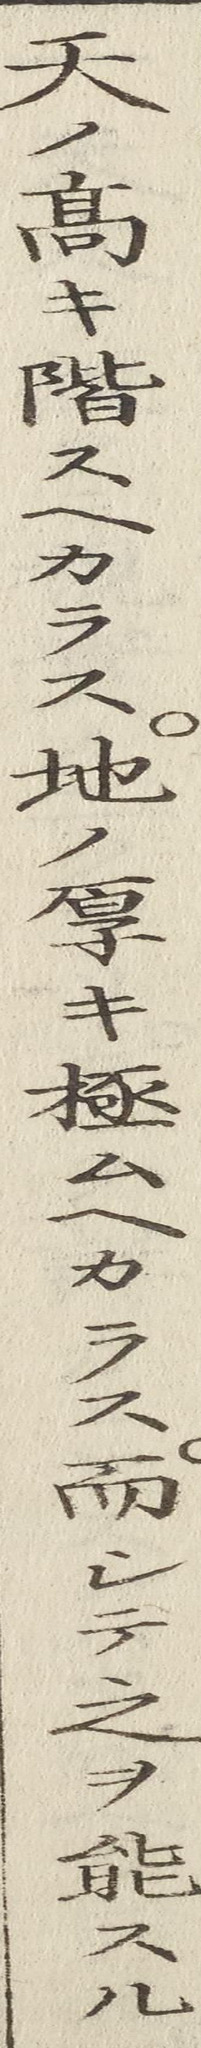天ノ高キ階スヘカラス。地ノ厚キ極ムヘカラス。而シテ之ノ能スル
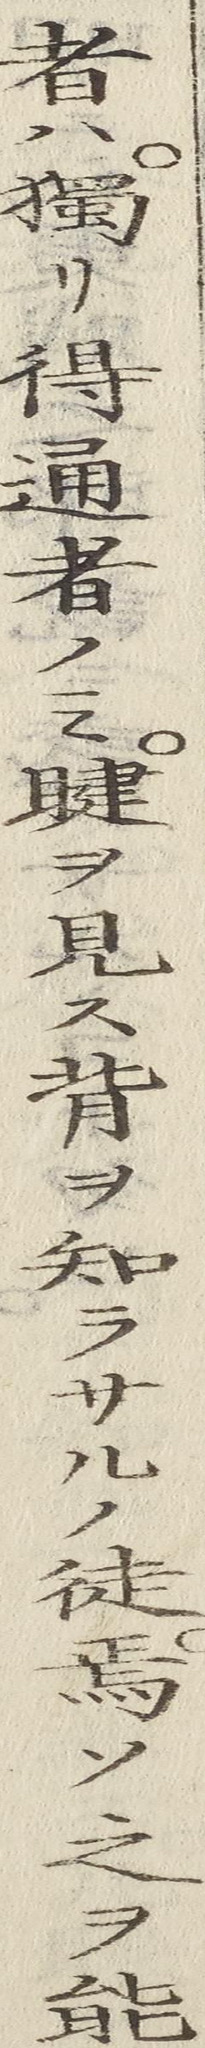者ハ。独リ得通者ノミ。腱ヲ見ス背ヲ知ラサルノ徒。焉ソ之ヲ能
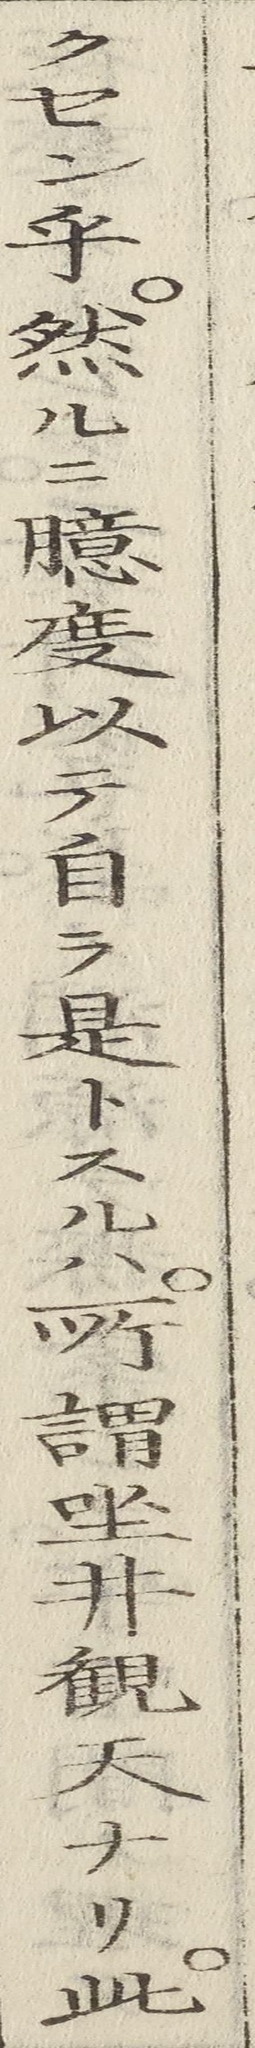クセン乎。然ルニ臆度以テ自ラ是トスルハ。所謂坐井観天ナリ。此
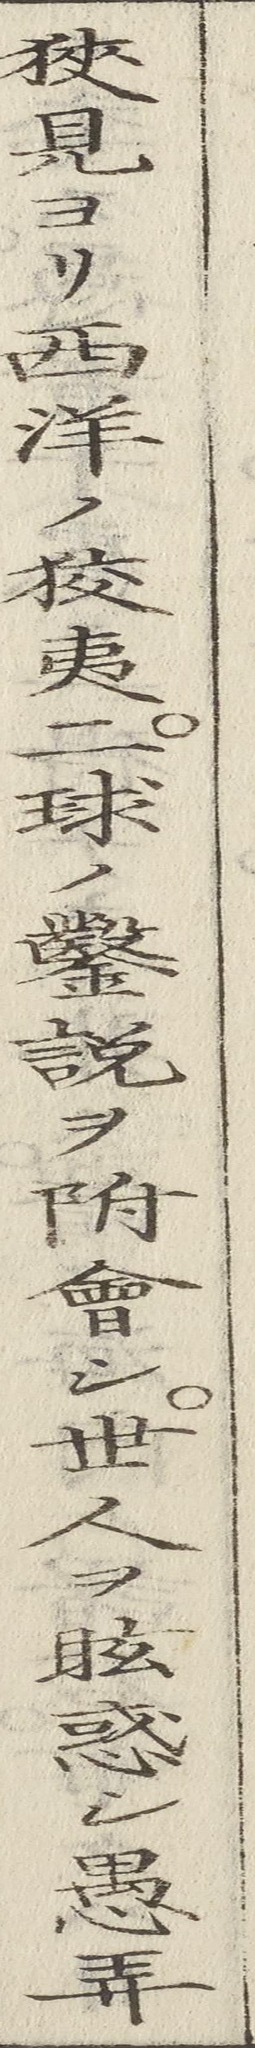狭見ヨリ西洋ノ狡夷。二球ノ鑿説ヲ付会シ。世人ヲ眩惑シ愚弄
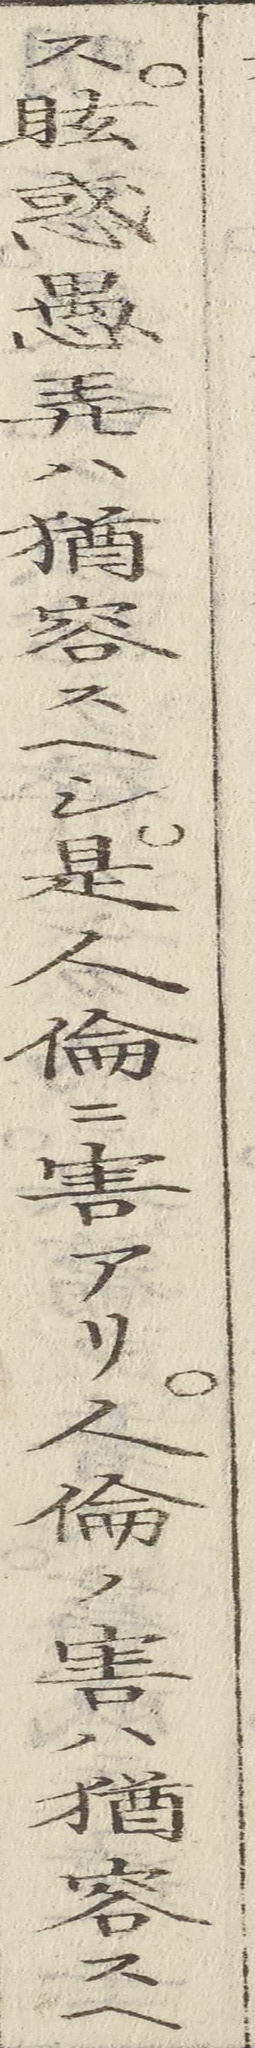ス。眩惑愚弄ハ猶容スヘシ。是人論ニ害アリ。人論ノ害ハ猶容スヘ
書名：護法新論　上
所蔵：東京大学地震研究所図書室 Earthquake Research Institute Library, The University of Tokyo, JAPAN
